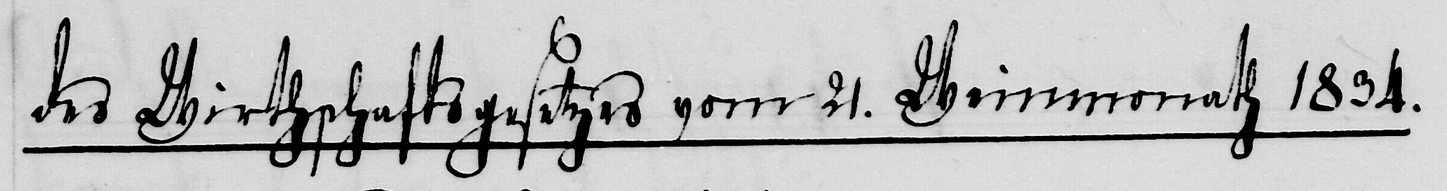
des Wirthschaftsgesetzes vom 21. Weinmonath 1834.
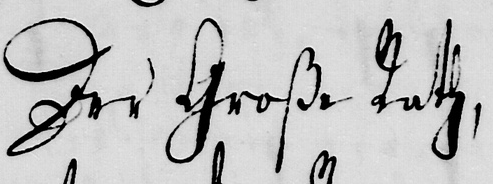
Der Große Rath,
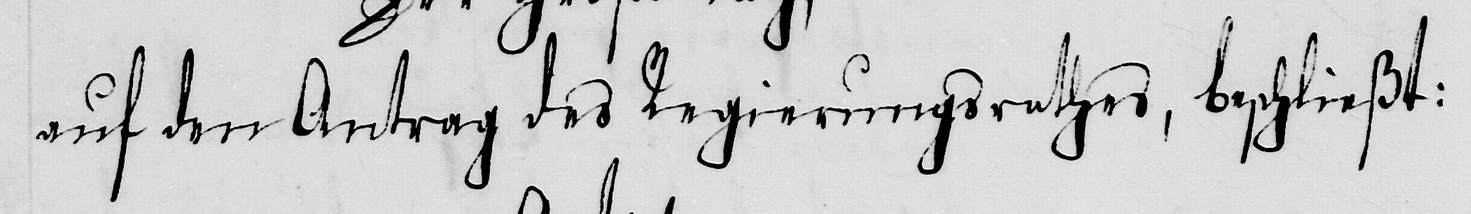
auf den Antrag des Regierungsrathes, beschließt:
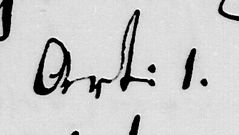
Art: 1.
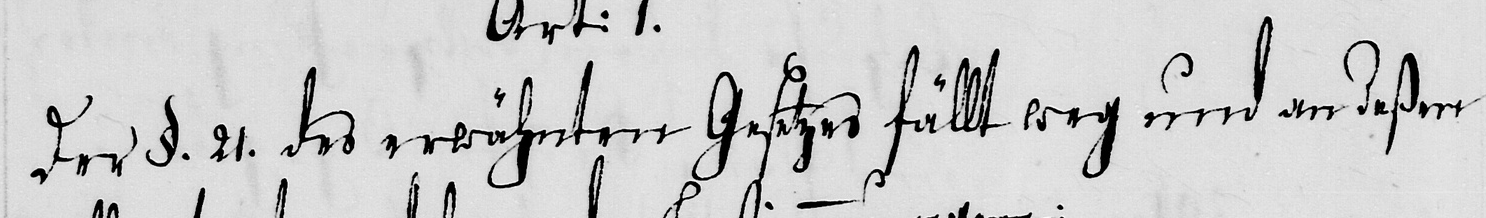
Der §. 21. des erwähnten Gesetzes fällt weg und an deßen
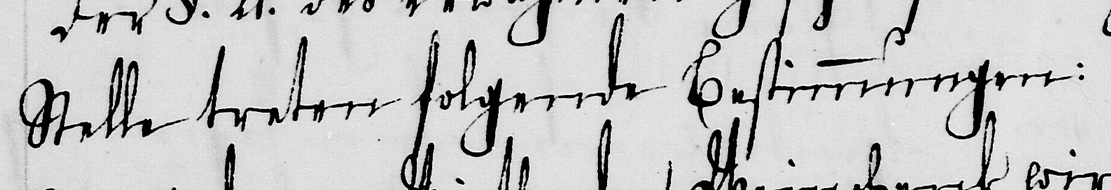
Stelle treten folgende Bestimmungen:
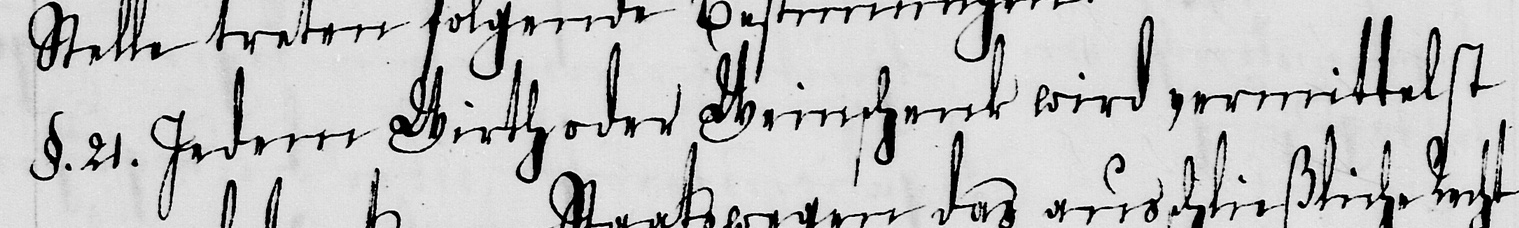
§. 21. Jedem Wirth oder Weinschenk wird vermittelst
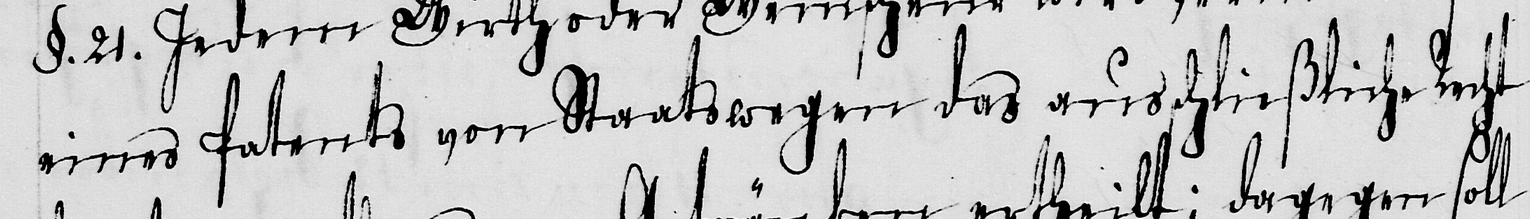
eines Patents von Staatswegen das ausschließliche Recht
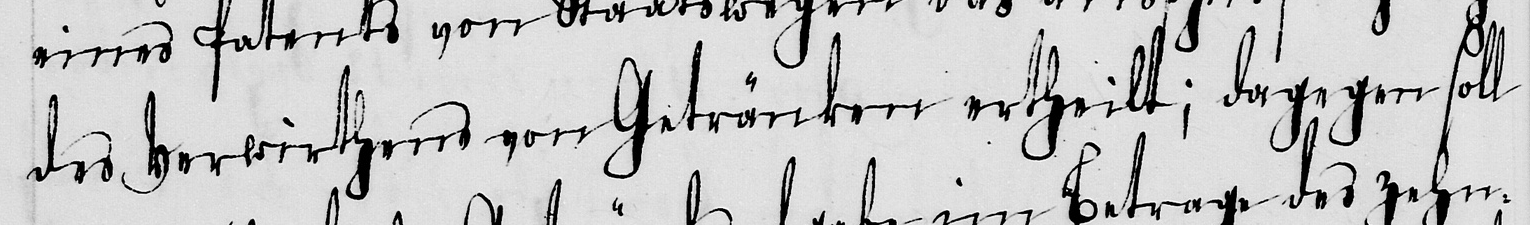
des Verwirthens von Getränken ertheilt; dagegen soll
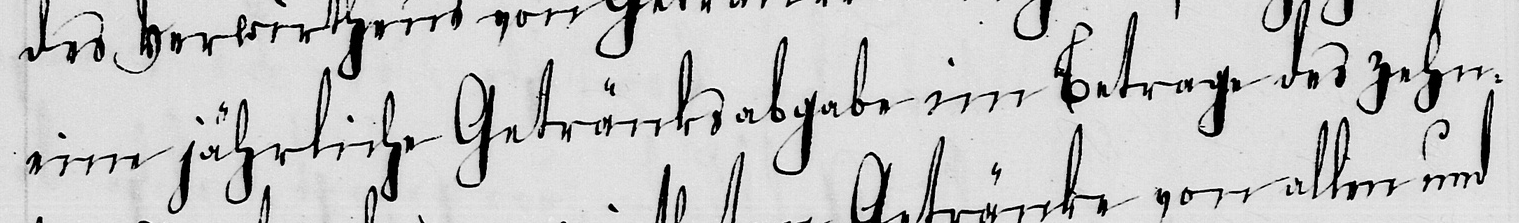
eine jährliche Getränksabgabe im Betrage des zehn¬
